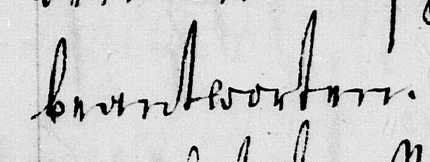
beantworten.
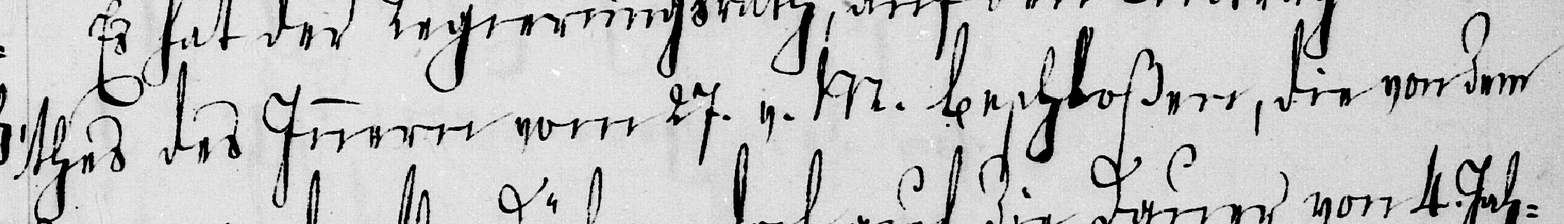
thes des Innern vom 27. v. M. beschloßen, die von dem
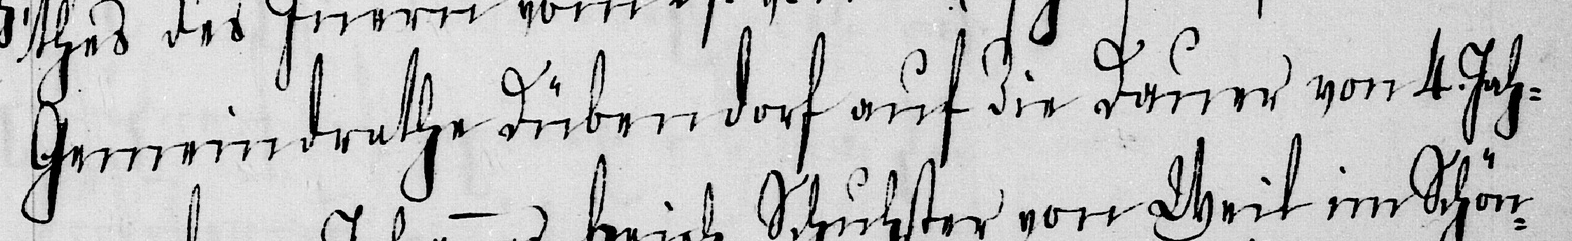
Gemeindrathe Dübendorf auf die Dauer von 4. Jah¬
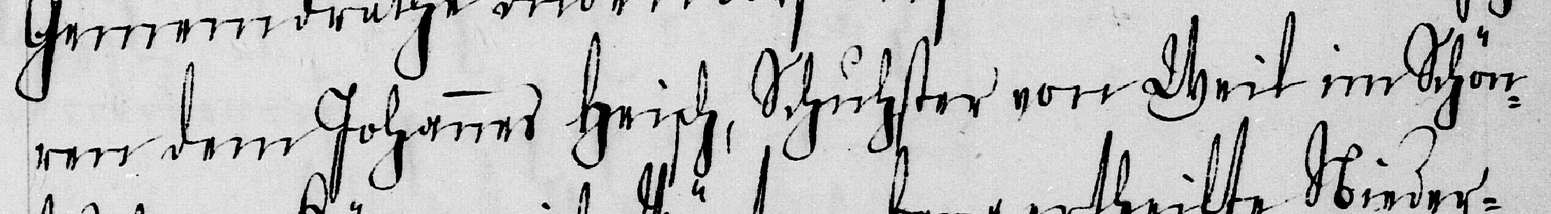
ren dem Johannes Heisch, Schuhster von Weil im Schön¬
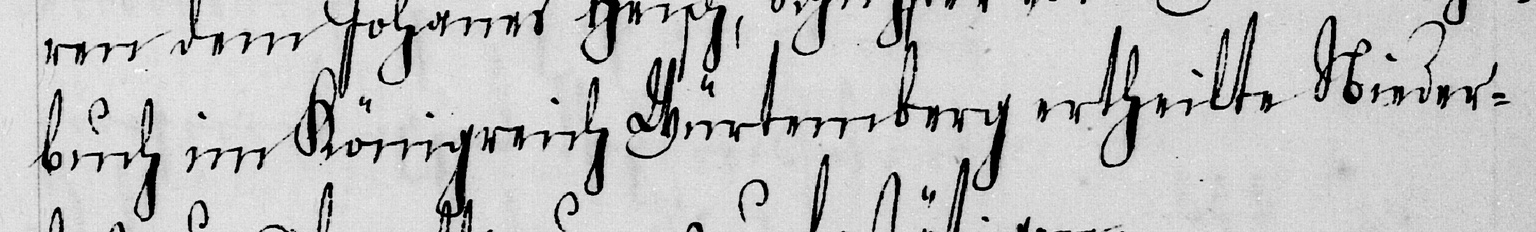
buch im Königreich Würtemberg ertheilte Nieder¬
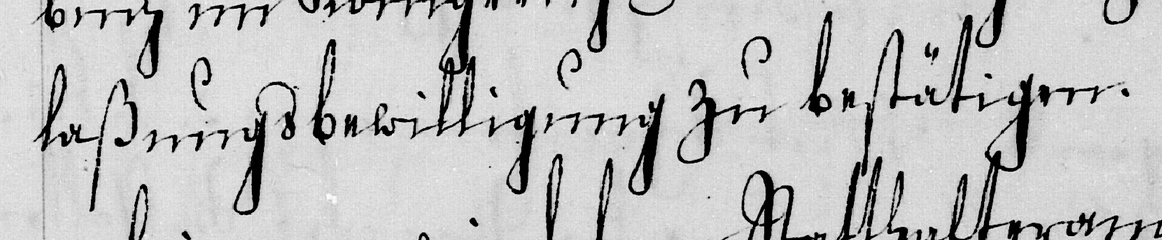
laßungsbewilligung zu bestätigen.
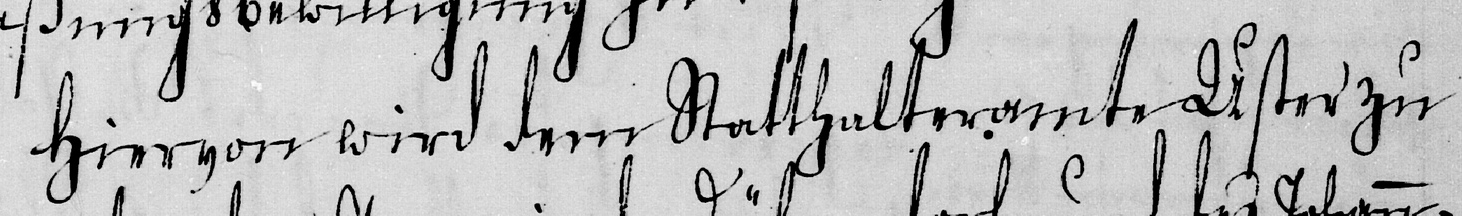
Hiervon wird dem Statthalteramte Uster zu
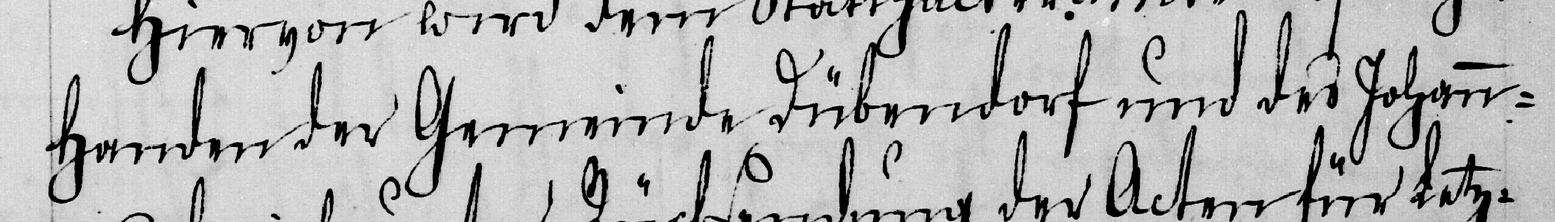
Handen der Gemeinde Dübendorf und des Johan¬
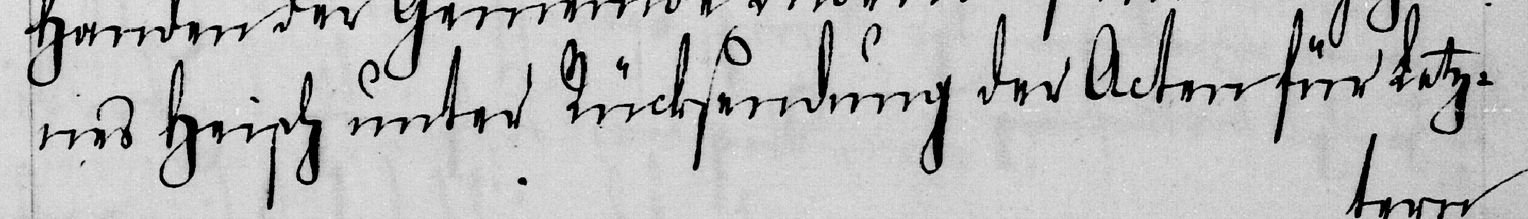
nes Heisch unter Rücksendung der Acten für Letz-
